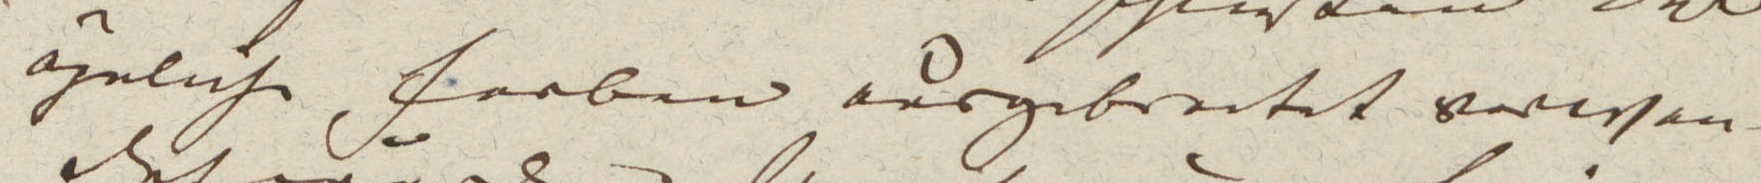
"ähnliche Farben ausgebreitet verwen-
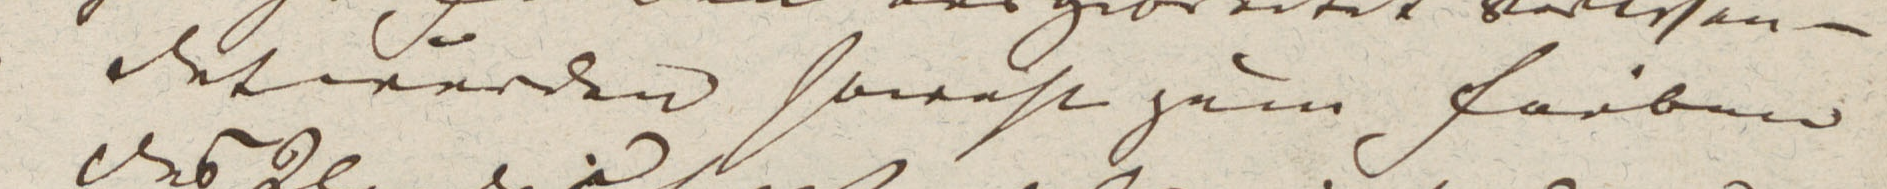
"det würden sowohl zum Färben
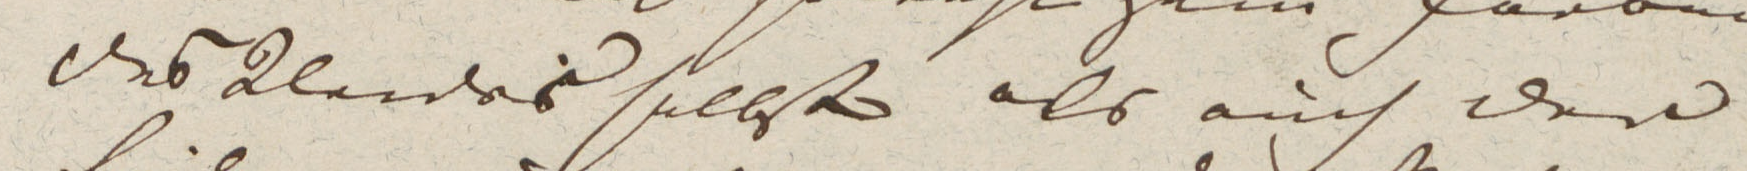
"des Kleides selbst als auch der
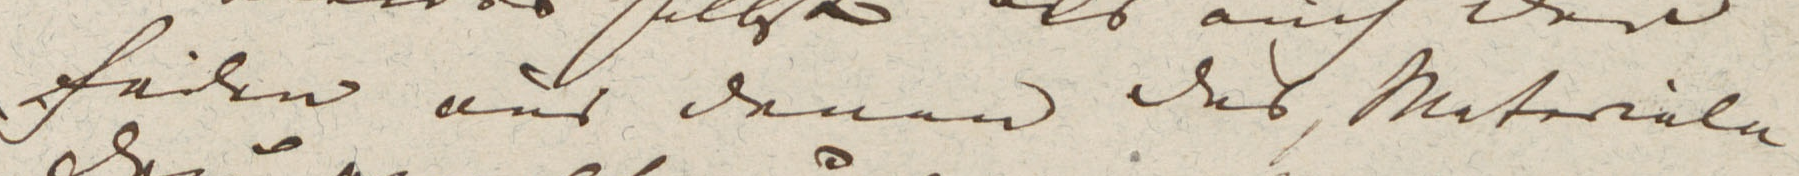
"Fäden aus denen das Materiale
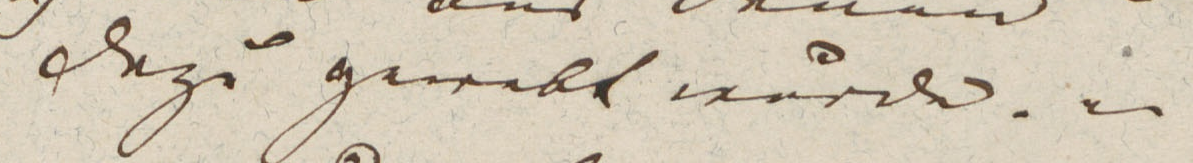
"dazu gewebt wurde. – .
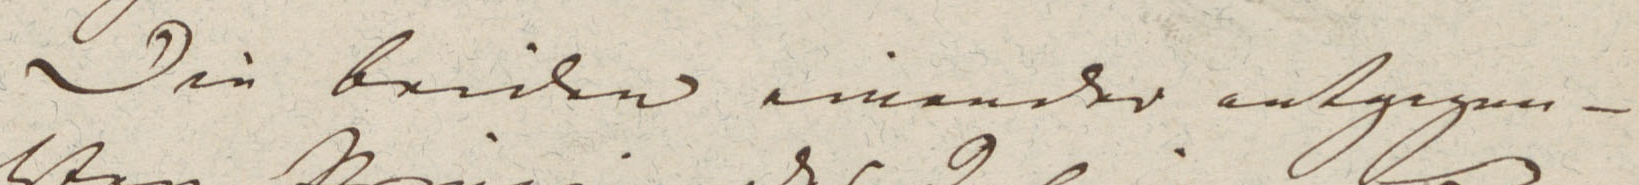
Die beiden einander entgegen-
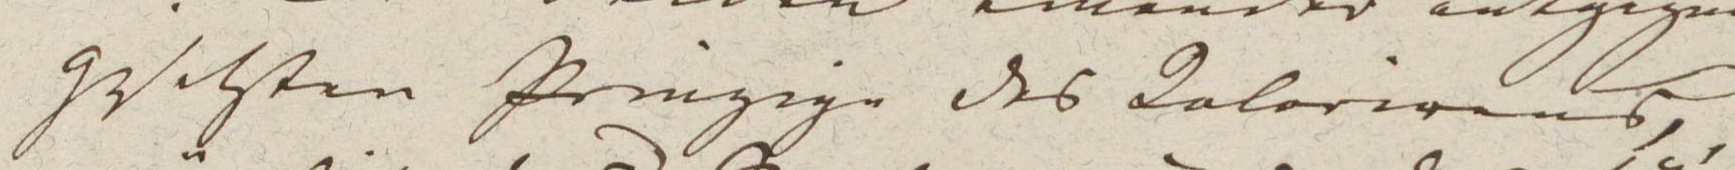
gesetzten Prinzipe des Kolorirens,
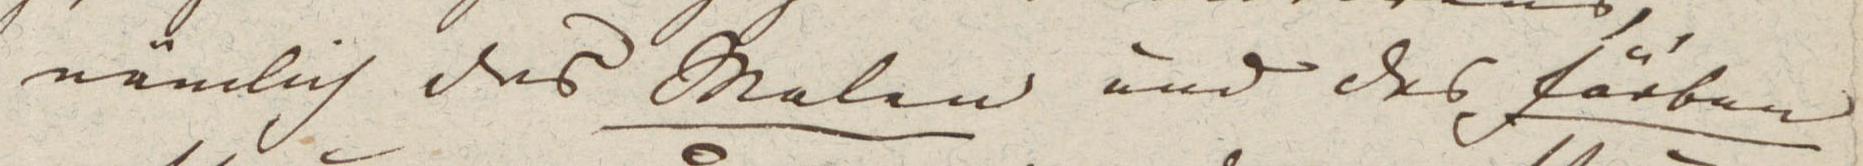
nämlich das Malen und das Färben
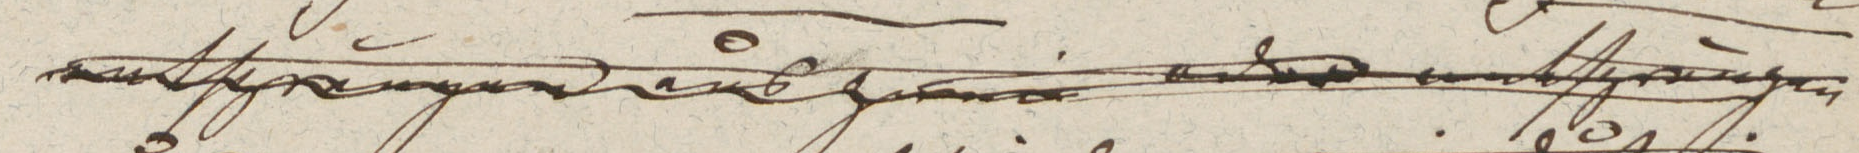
entsprungen aus zwei oder entsprungen
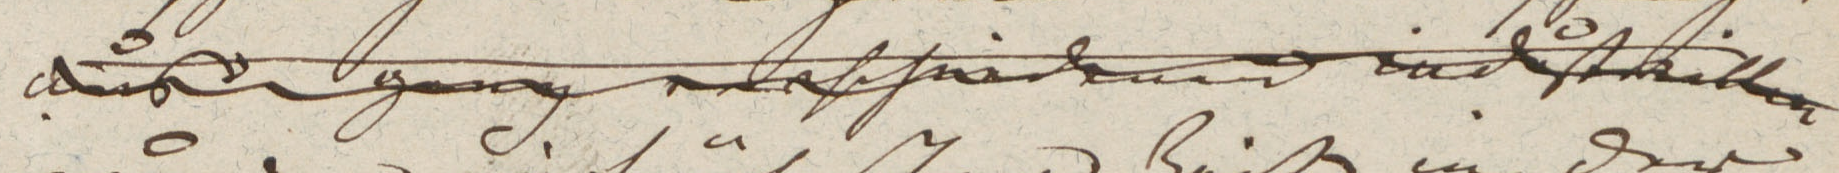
aus ganz verschiedenen industriellen
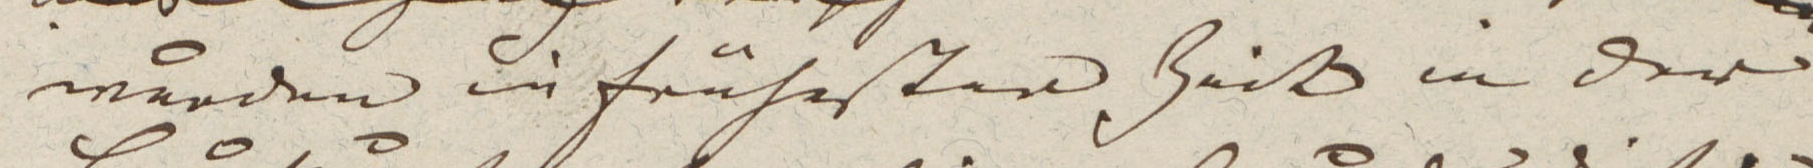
wurden in frühester Zeit in der
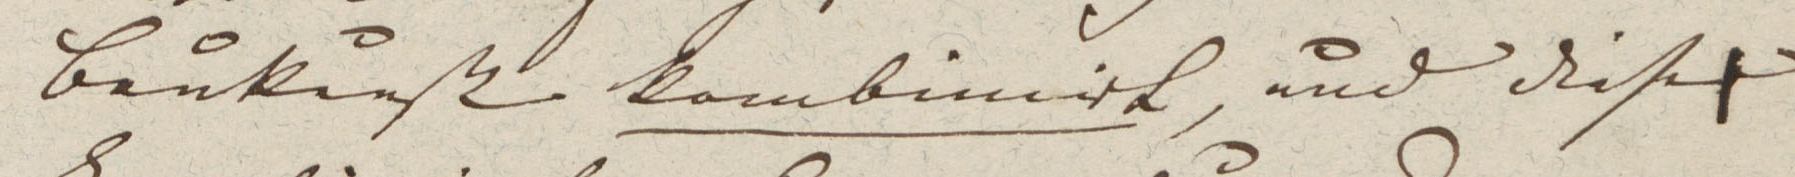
Baukunst kombinirt, und dieser
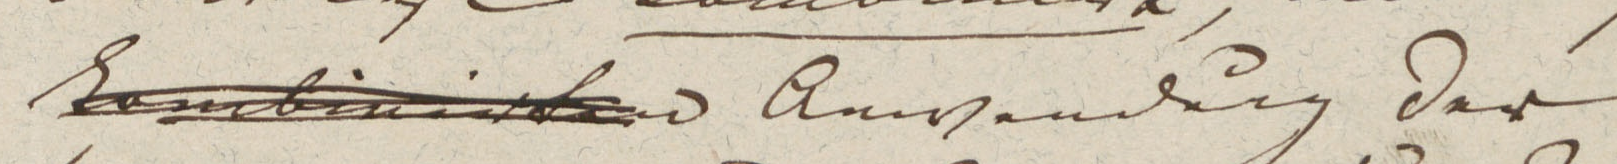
kombinirten Anwendung der
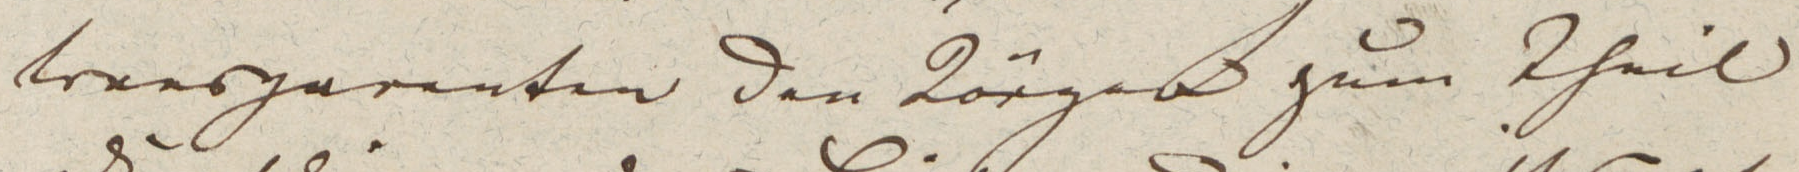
transparenten den Körper zum Theil
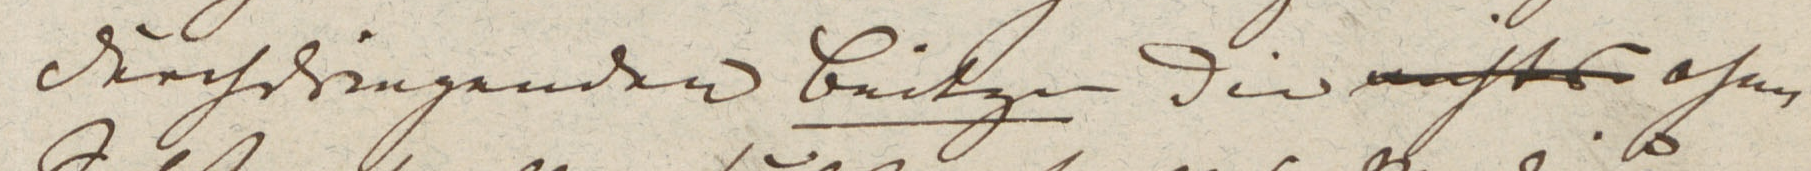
durchdringenden Beitze die nichts ohne
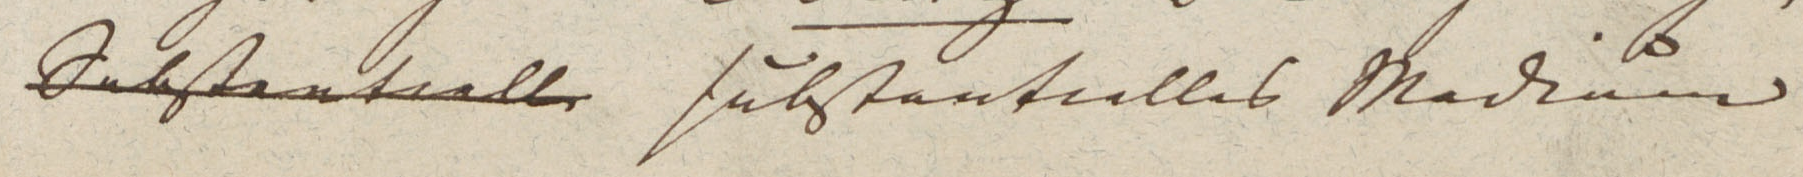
Substantielle substantielles Medium
